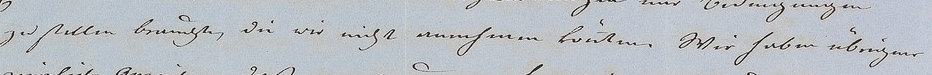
zu stellen brauchte, die wir nicht annehmen könnten. Wir haben übrigens
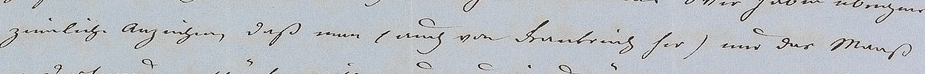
ziemliche Anzeichen, daß man (auch von Frankreich her) nur das Maaß
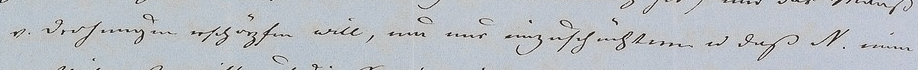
v. Drohungen erschöpfen will, um uns einzuschüchtern u daß N. einen
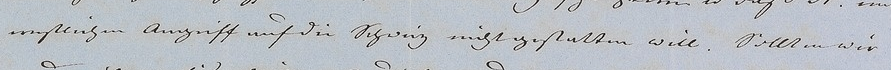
ernstlichen Angriff auf die Schweiz nicht gestatten will. Sollten wir
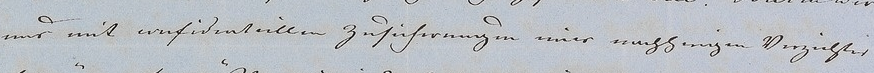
uns mit confidentiellen Zusicherungen eines nachherigen Verzichtes
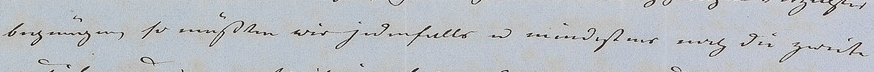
begnügen, so müßten wir jedenfalls u mindestens noch die zweite
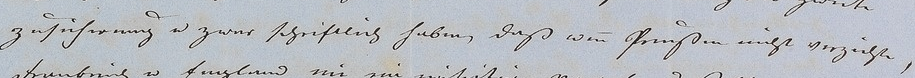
Zusicherung u zwar schriftlich haben, daß wenn Preußen nicht verzichte,
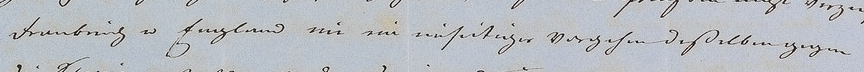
Frankreich u England nie ein einseitiges Vorgehen desselben gegen
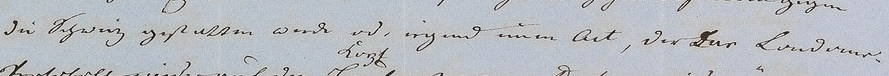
die Schweiz gestatten werde od. irgend einen Act, der das Londoner-
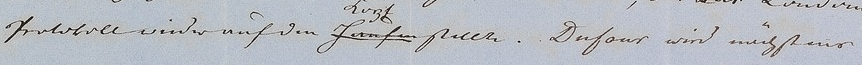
Protokoll wieder auf den HaufenKopf stellte. Dufour wird nächstens
